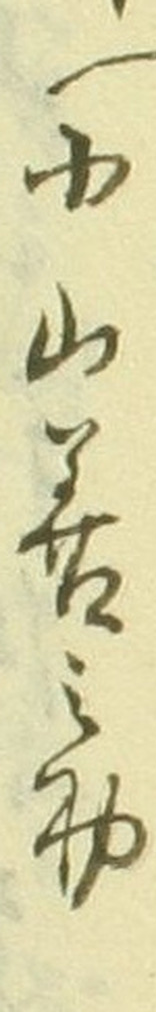小山善之助
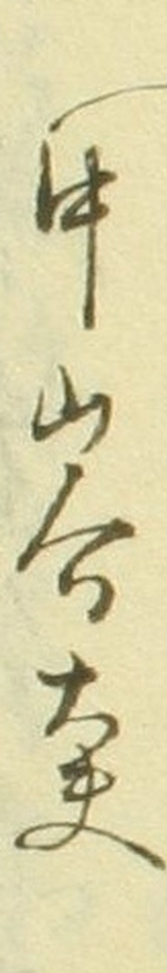中山合太夫
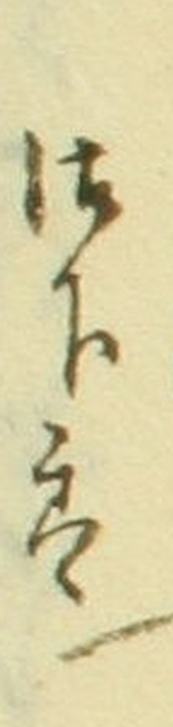御下？
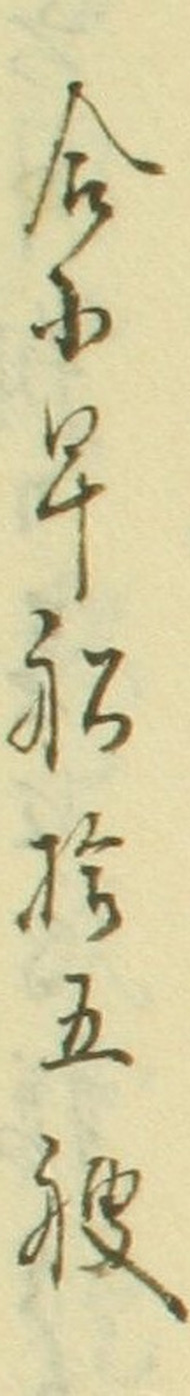合小早船拾五艘

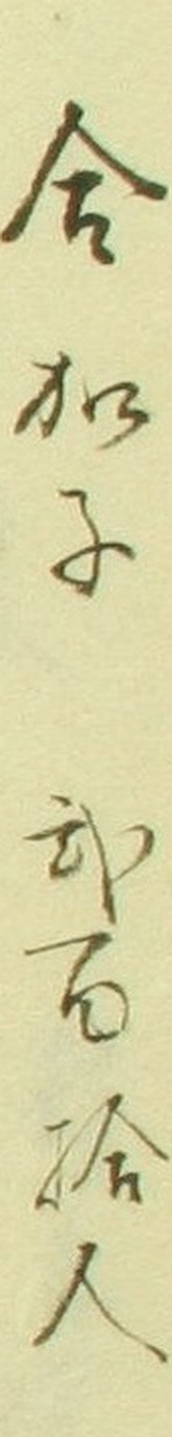合加子弐百拾人
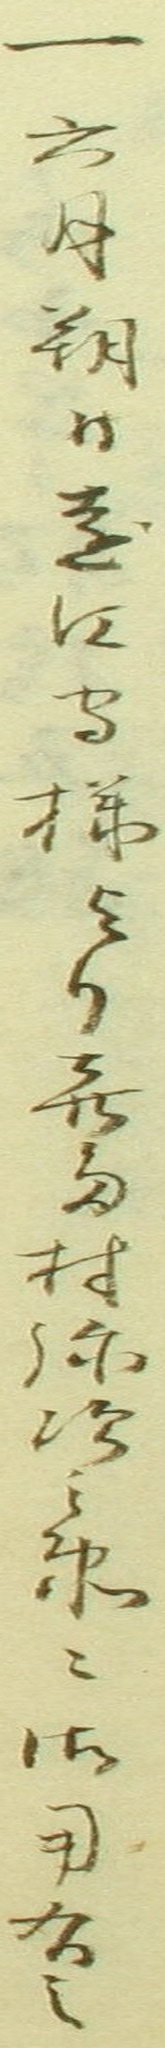一六月朔日遠江守様より喜多村弥次兵衛に御用有之
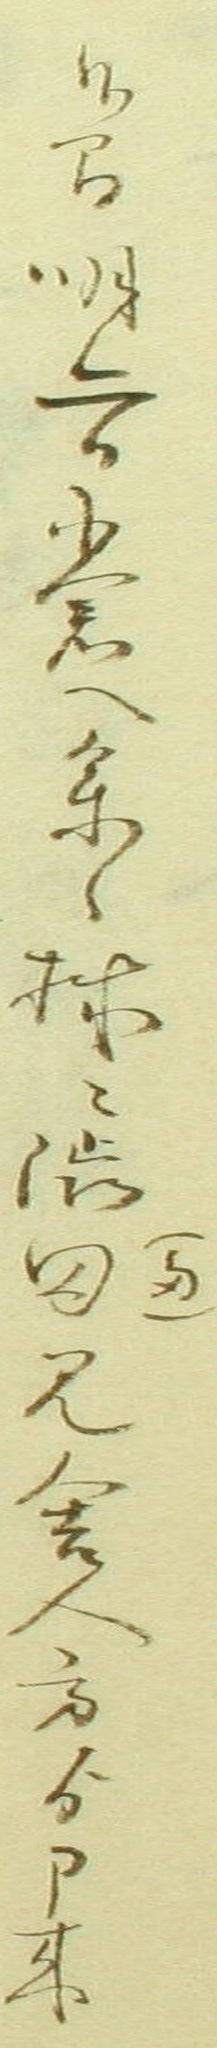候間明二日小倉へ参候様渋多見舎人方ゟ申来
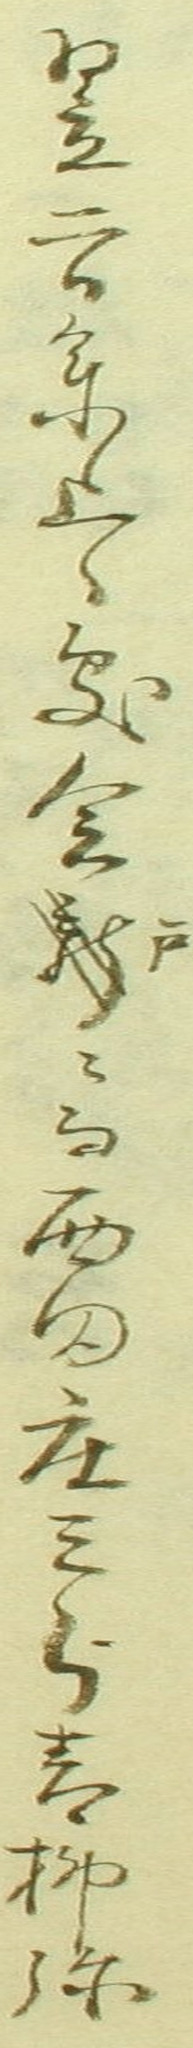翌二日参上候處会所に而西田庄三郎青柳弥
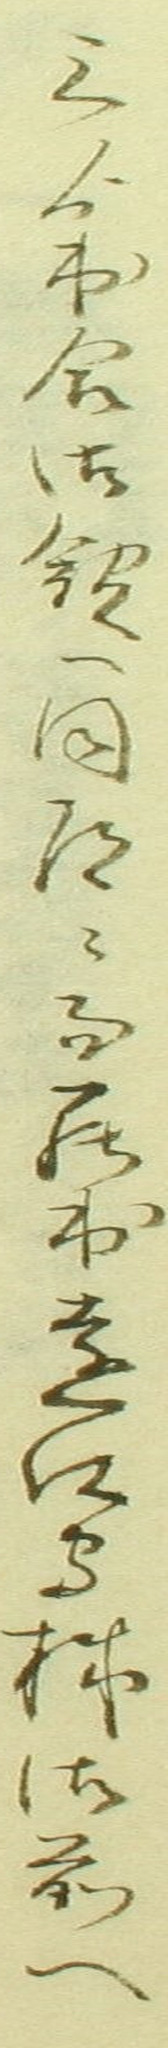三ゟ出会御館へ同道に而罷出遠江守様御前へ
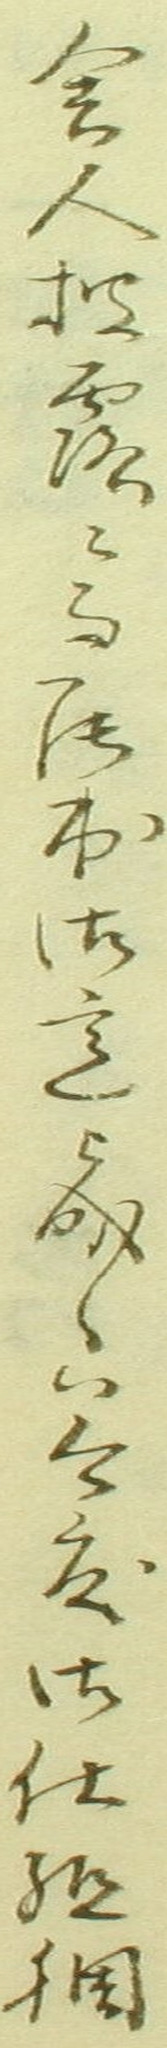舎人披露に而罷出御意被成候は今度御仕組稠
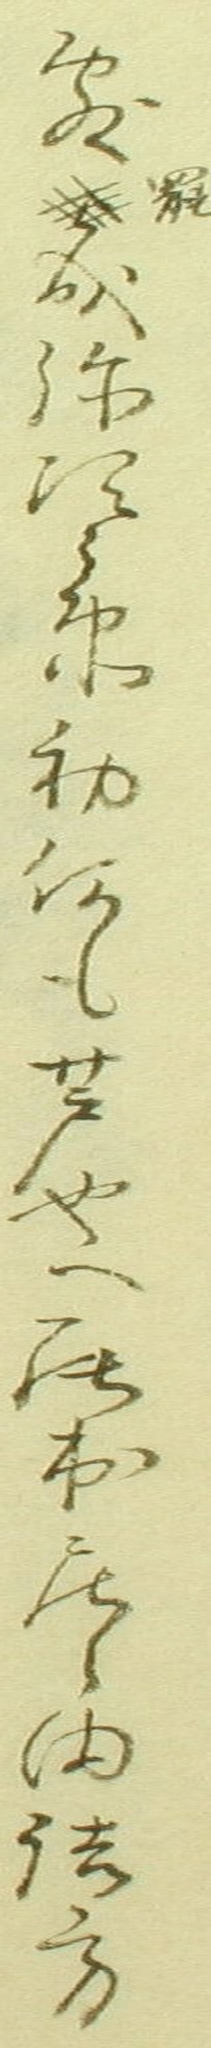敷？成弥次兵衛初何も芦やへ罷出に仕候由詰方
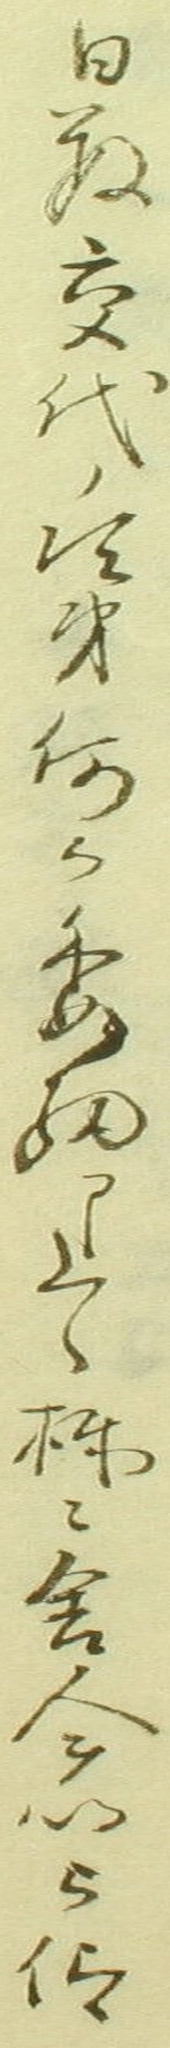日数交代の次第何か委細申上候様に舎人を以被仰
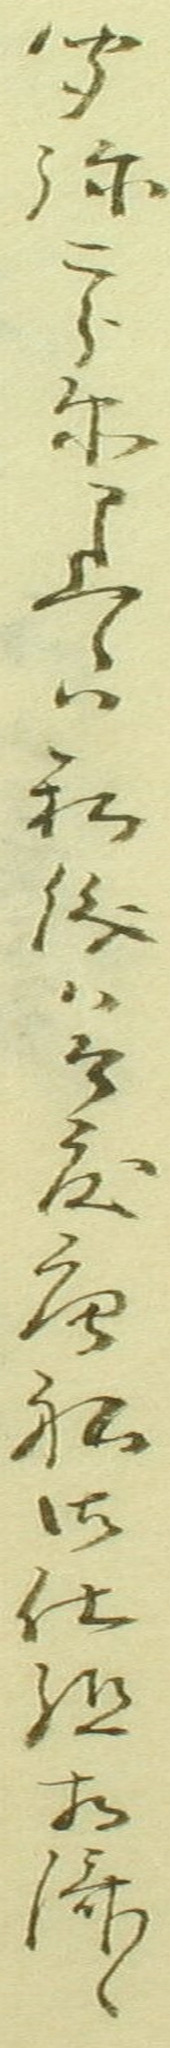聞弥二郎兵衛申上候は私儀は今度唐船御仕組相済候
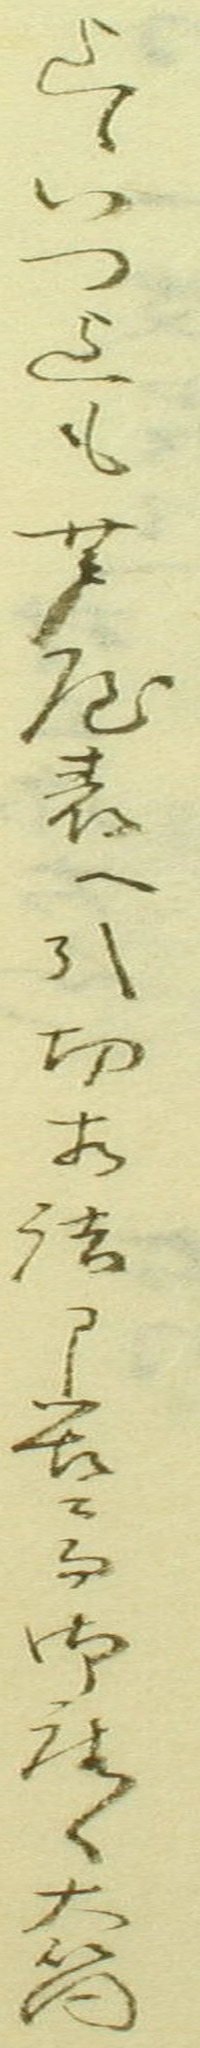迄候いつ迄も芦屋表へ引切相詰申筈に而御座候大筒
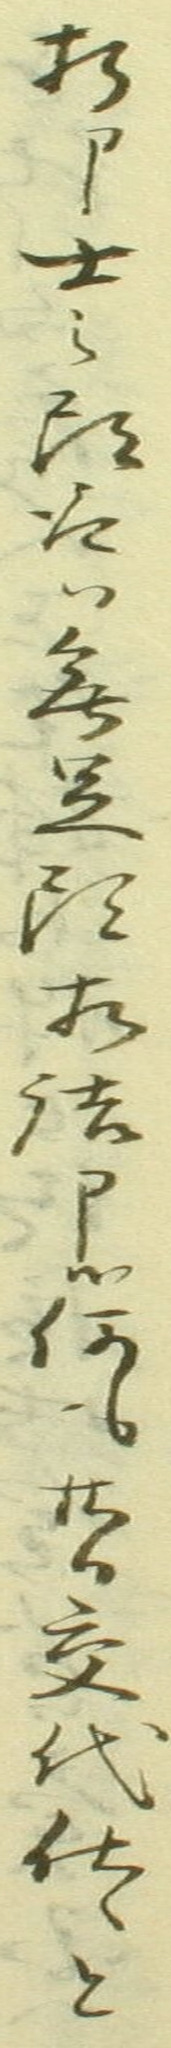打申士之頭取は無足頭相詰申候何も廿日交代仕候と
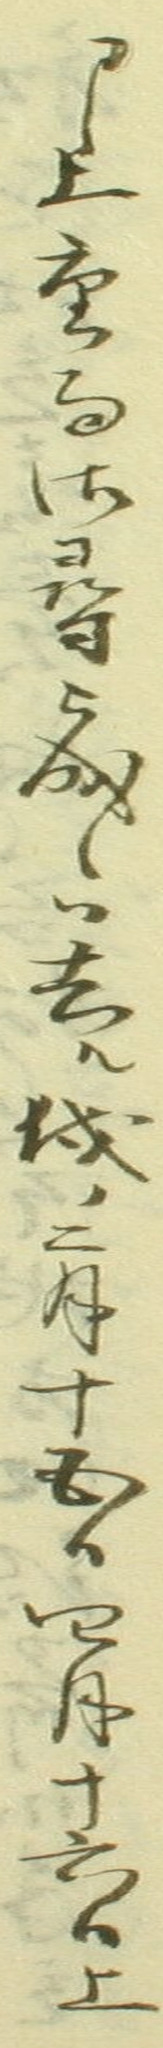申上重而御尋被成候は去る戌の二月而十五日四月十六日上
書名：唐船漂流記 四
